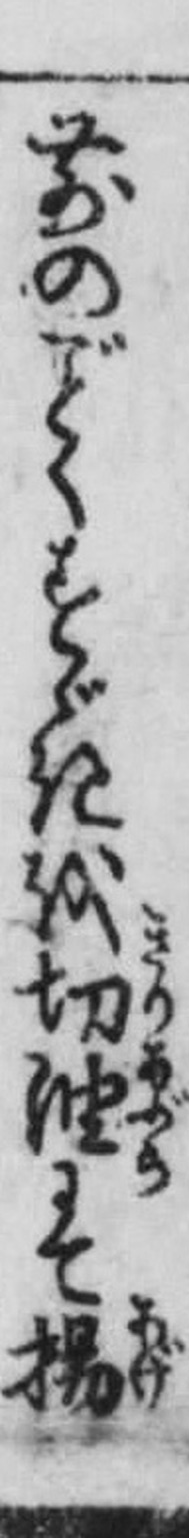前のごとくすゞきを切油にて揚
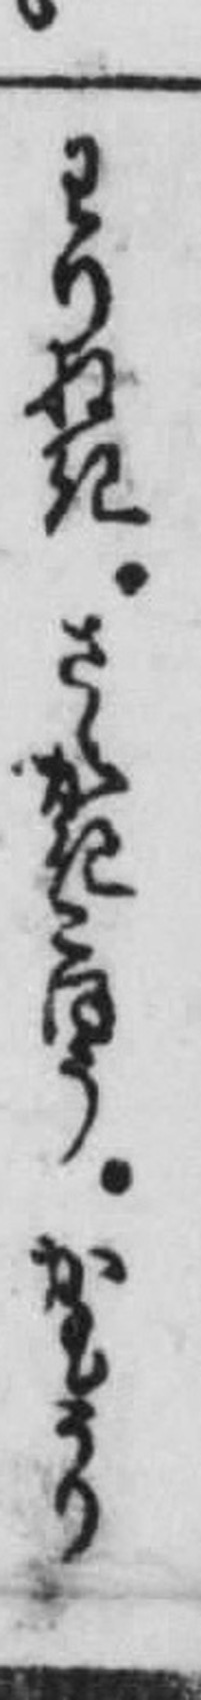わりねき。さゝかきこほう。かもうり
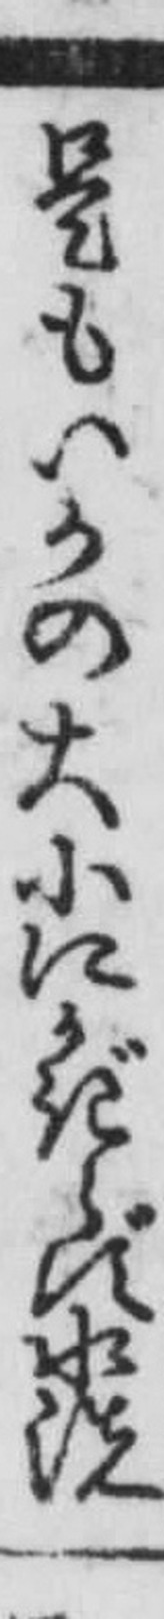是もいかの大小にかぎらず水洗
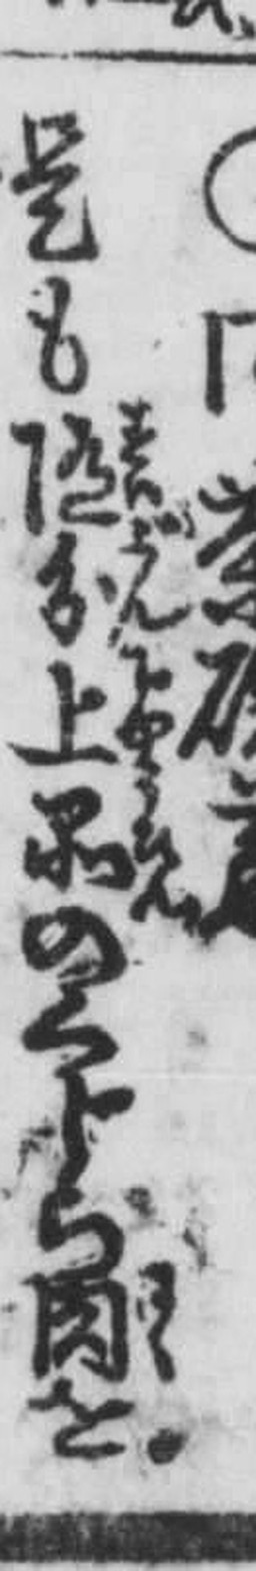是も随分上品のくじら肉を
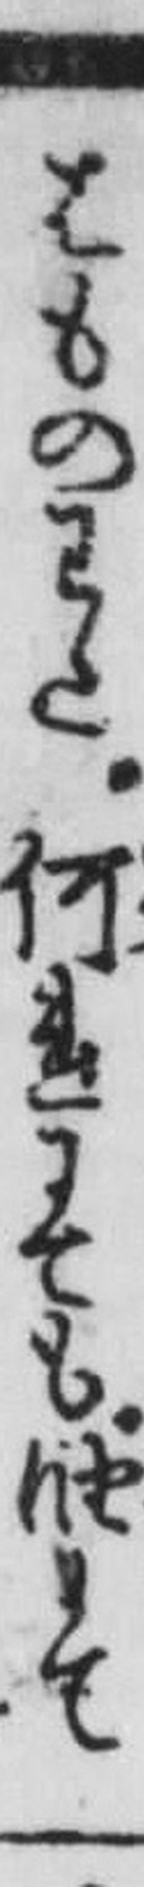はものわた。何れにても油にて
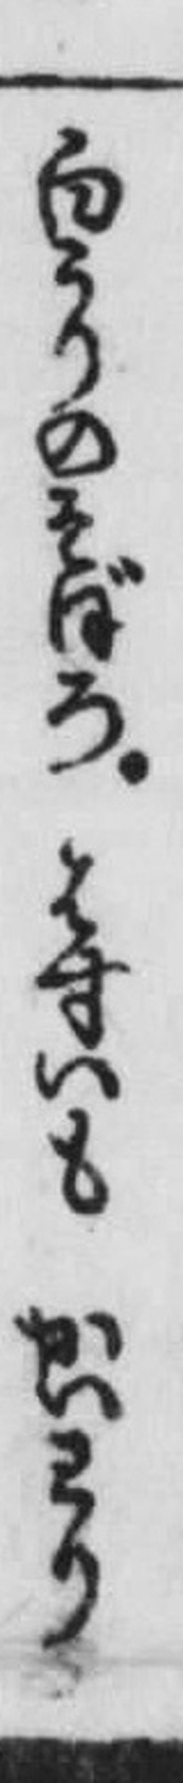白うりのそぼろ。はすいも。かいわり
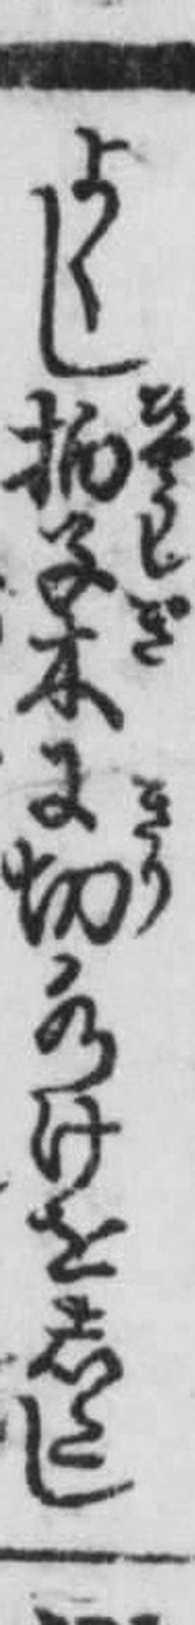よくし拍子木に切水けをしたし
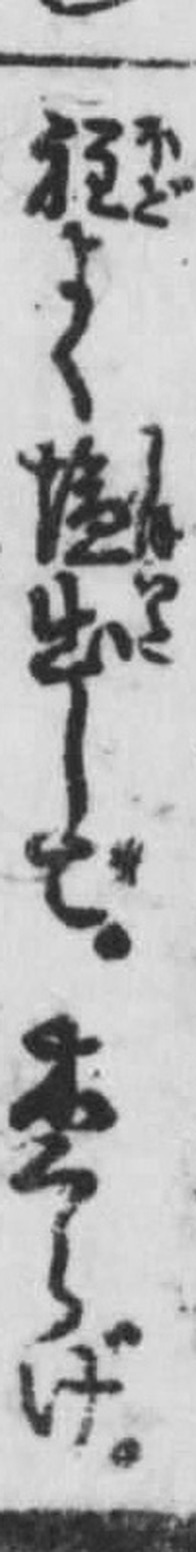程よく塩出して木くらげ
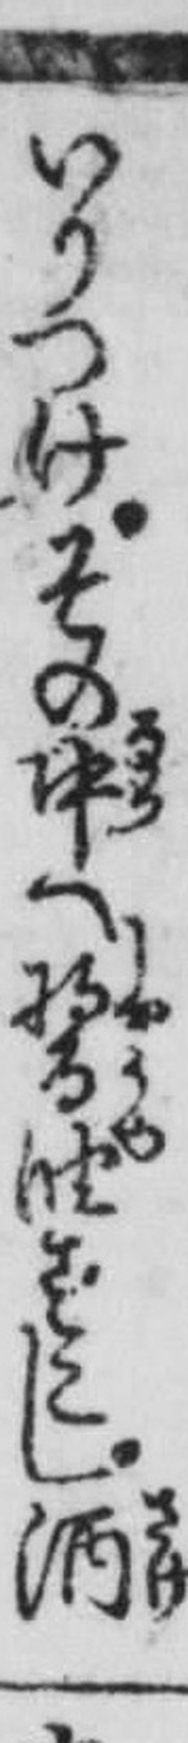いりつけ。その中へ醤油すこし。酒
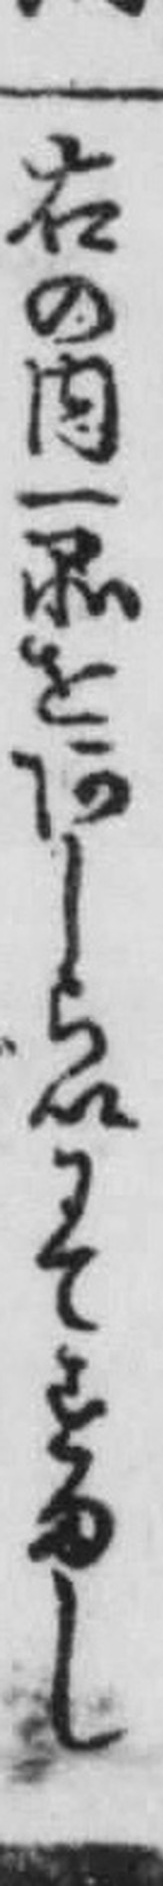右の内一品をあしらいにてすまし
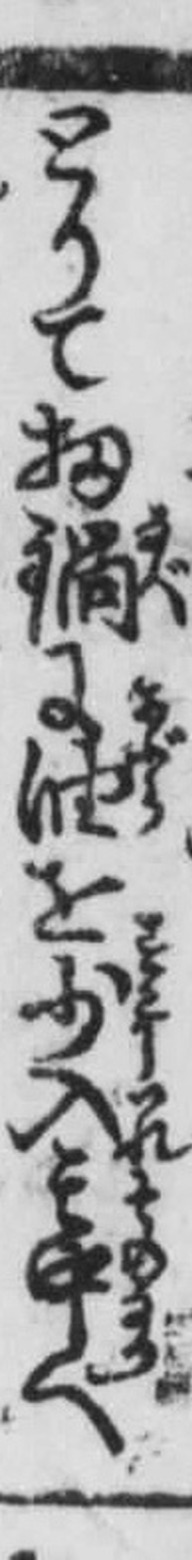とりて扨鍋に油を少入其中へ
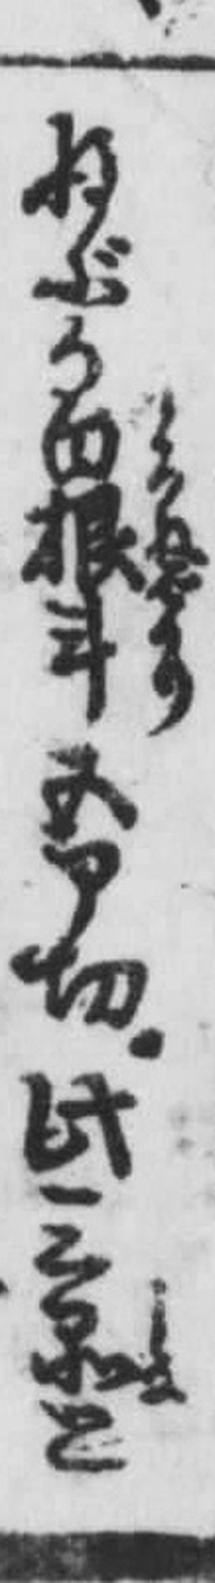ねぶか白根斗五部切此三品を
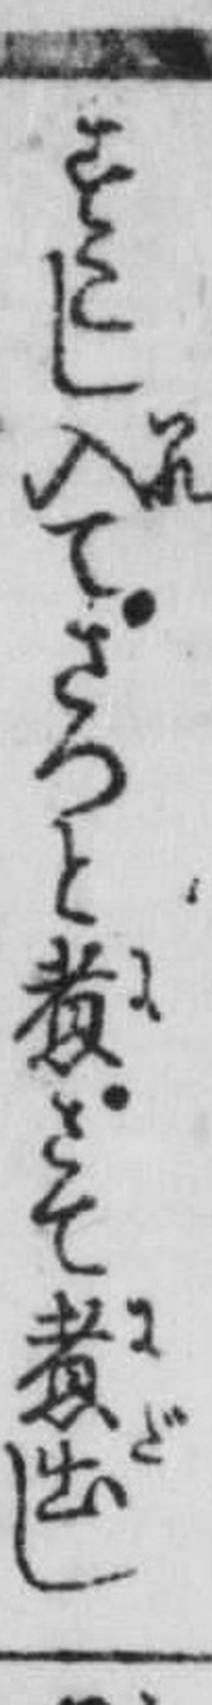すし入て。さつと煮。さて煮出し
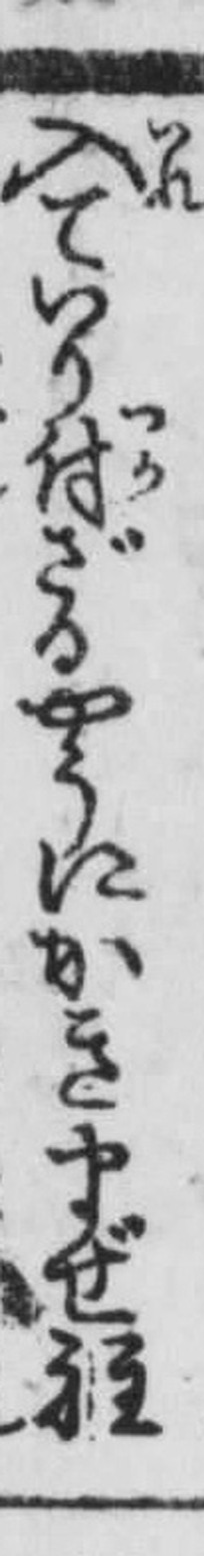入ていり付ざるやうにかきまぜ程
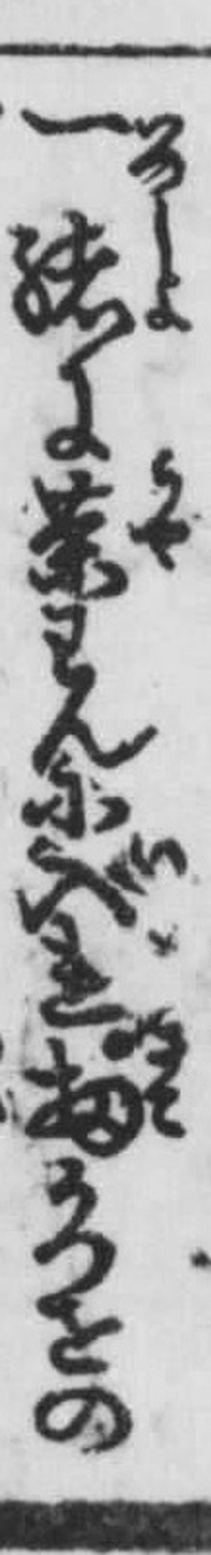一緒に茶わんに入れ扨かつをの
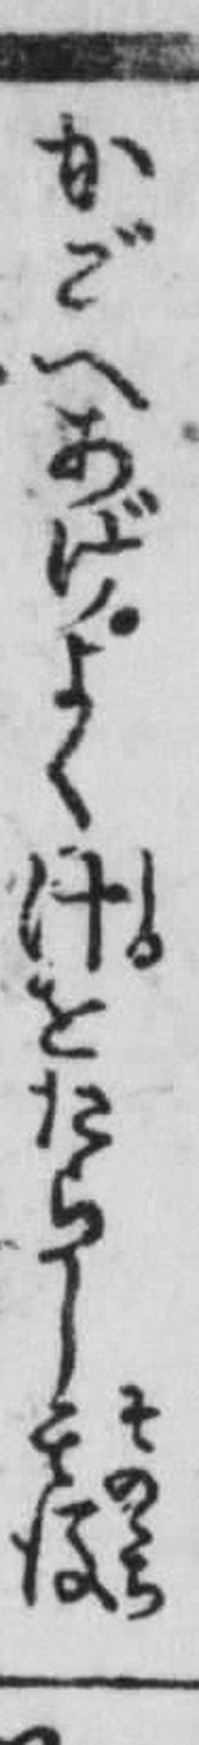かごへあげ。よく汁をたらし其後
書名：精進魚類間合料理/早速庖丁
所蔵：大阪府立大学学術情報センター 国文学研究資料館
